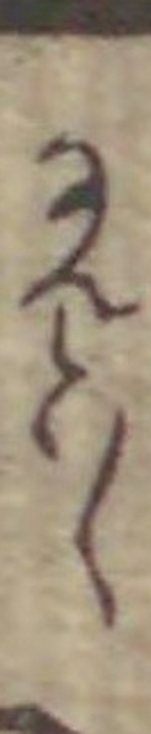なんと〳〵

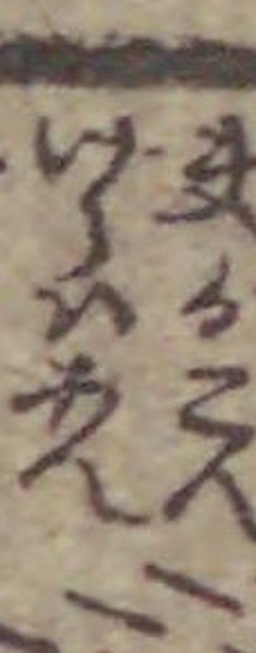けらはあん
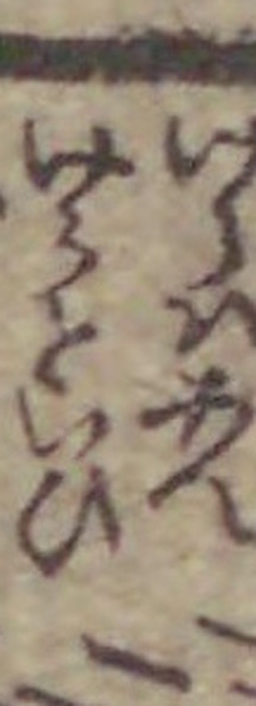けらといひ
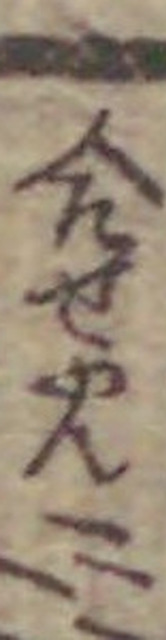合せやん
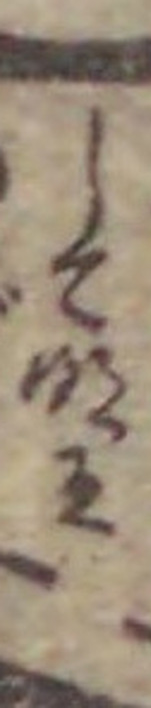して明王
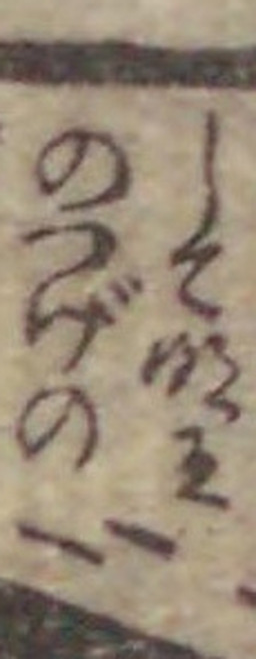のつげの
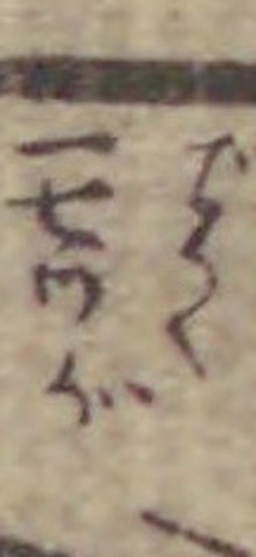一七日が
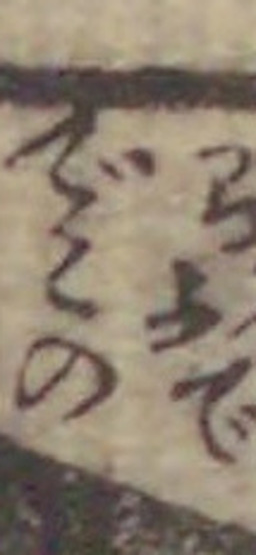でこの
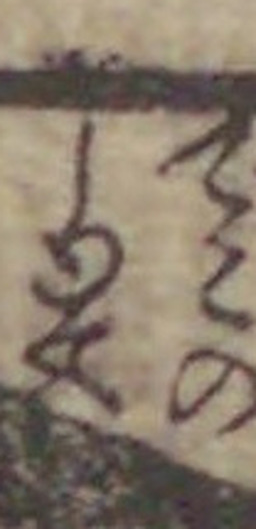しゆ文
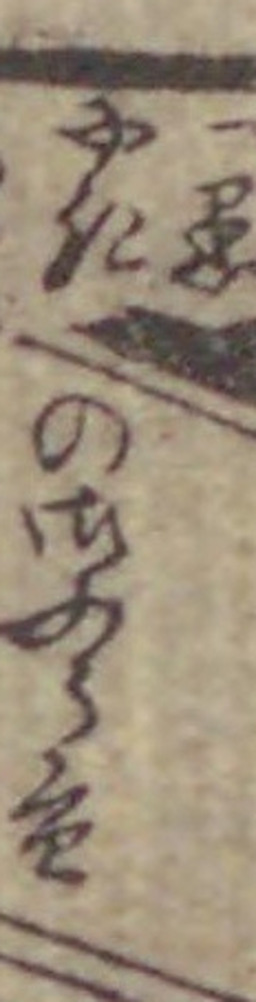やきの御ふう昼
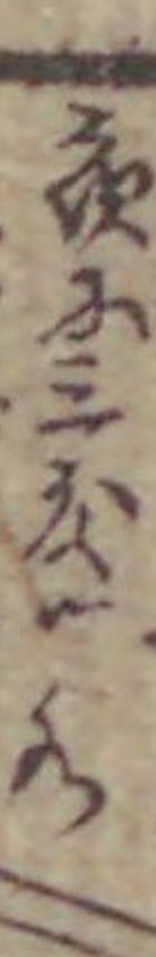夜に三度つゝ水
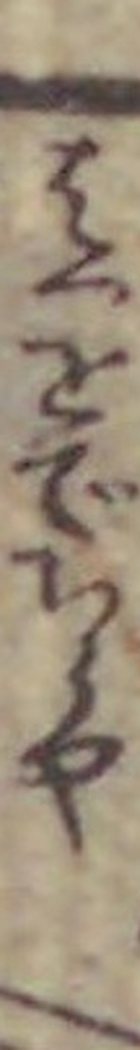はつをでちうや
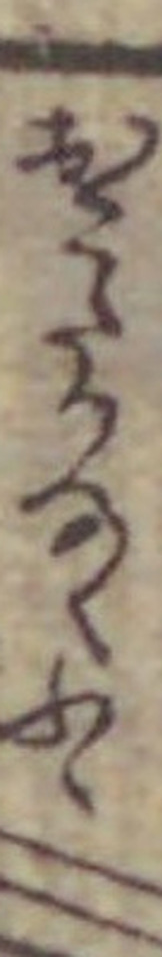おこたりなくふく
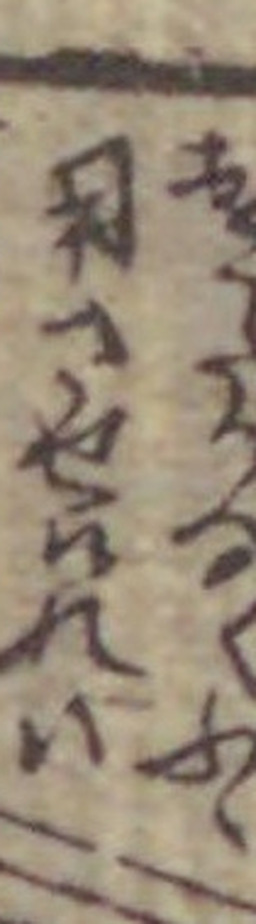用させけれは
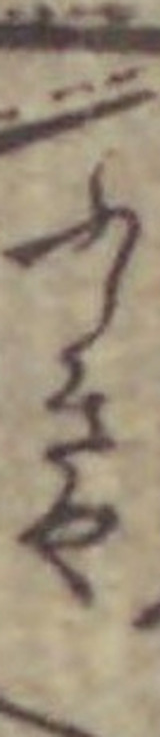ふしきや
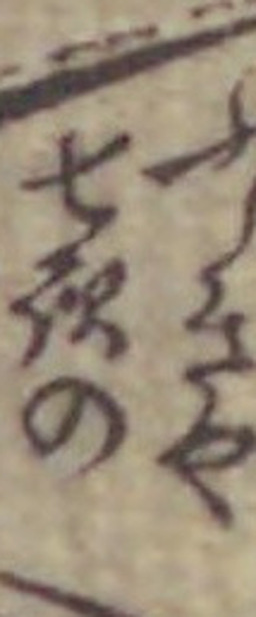七夜の
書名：止而道致虚録 3巻
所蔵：国立国会図書館 National Diet Library, JAPAN
